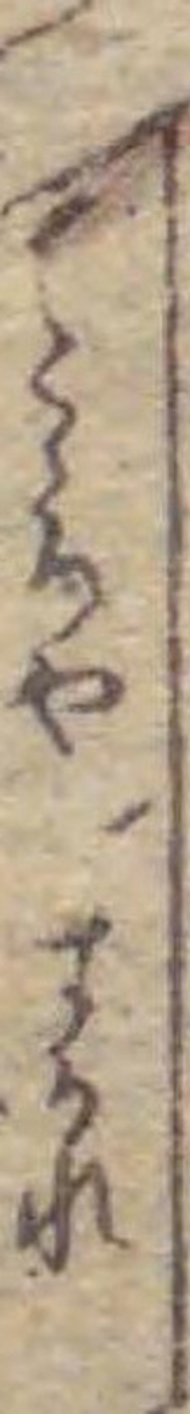こゝろやすかれ
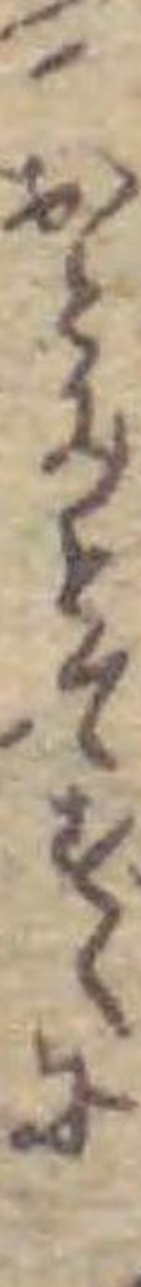おとみとてずくに
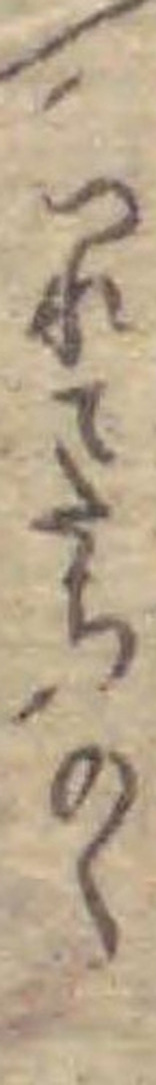つれてたちのく

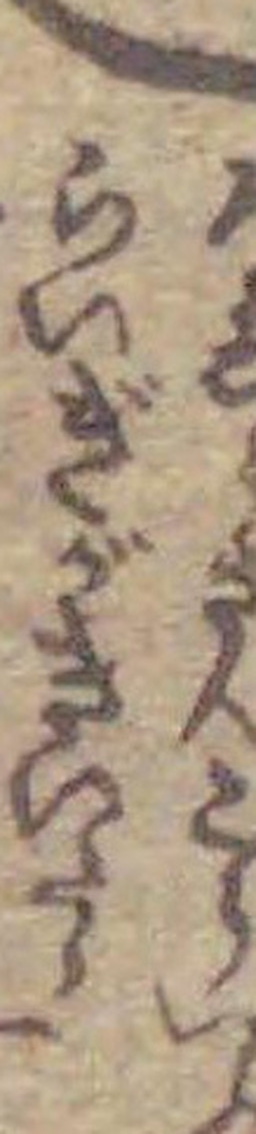らいぎがきいたら
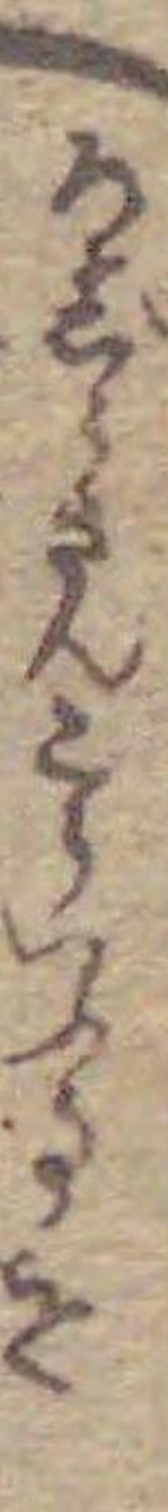ろじうさんこういふ事を
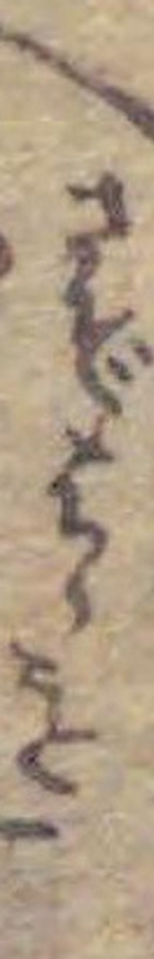さぞはらを
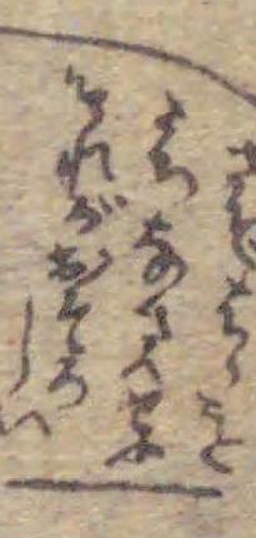それがおそろ
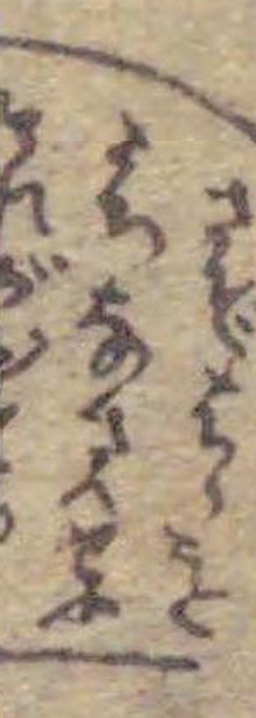たちなさんせふ
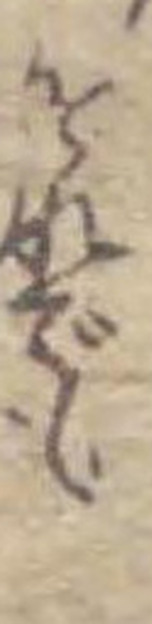それでも
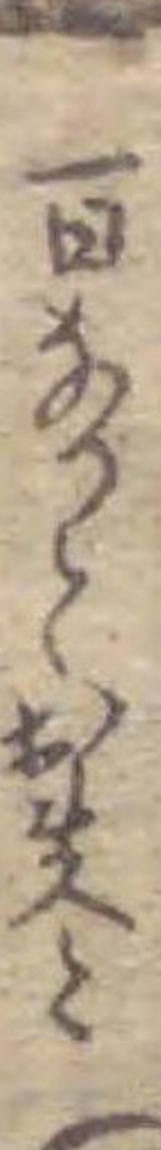一日なりとおまへと
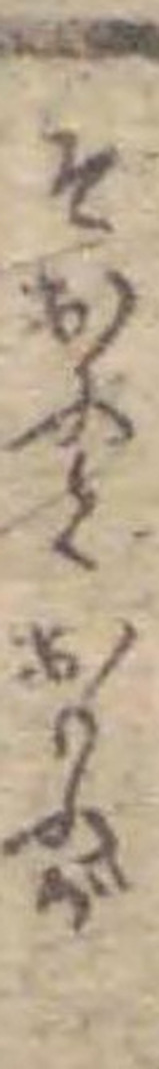そおふとおもふが
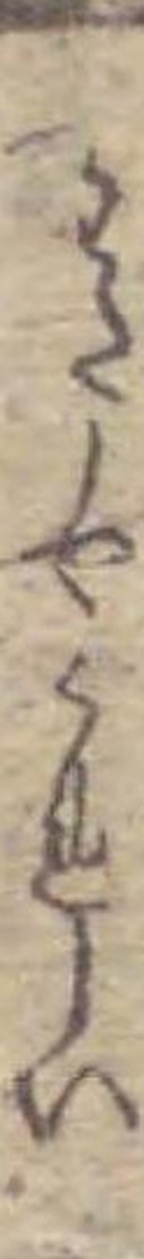わたしやうれしい
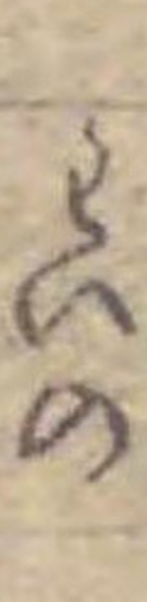わいの
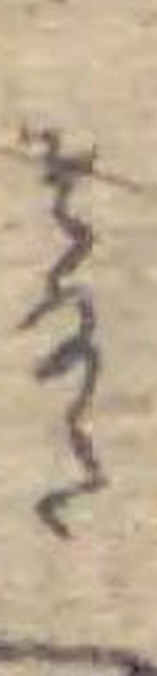そなた
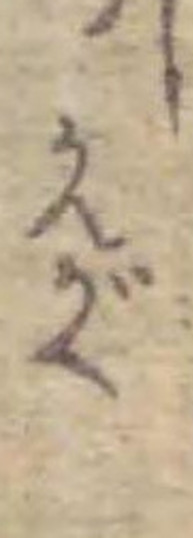かんがへ
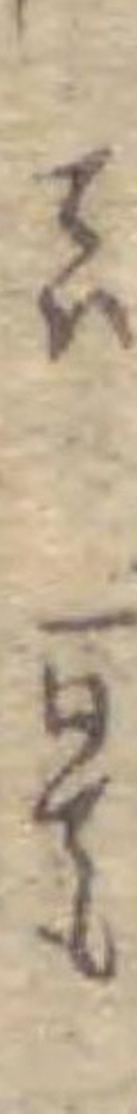ては一日ても
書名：芸者呼子鳥 : 2巻（松泉堂）
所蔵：国立国会図書館 National Diet Library, JAPAN
